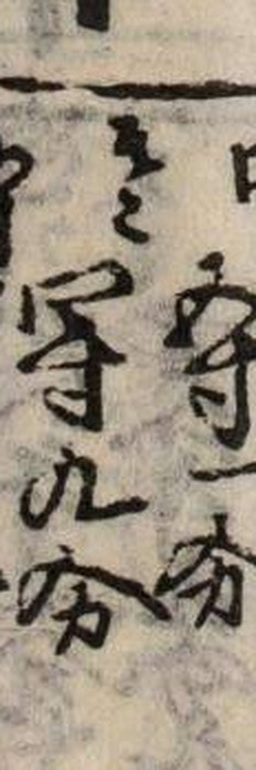そこ四寸九分
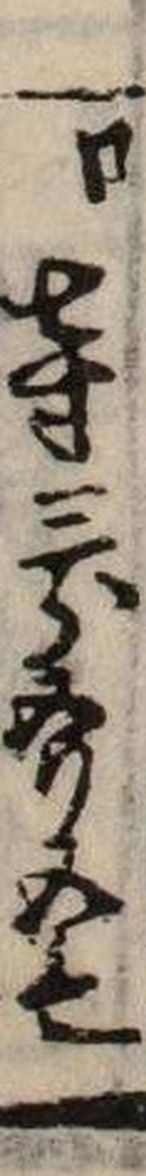六升口七寸三分五り五毛
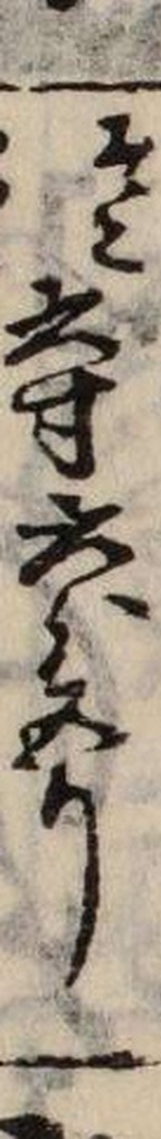そこ六寸六分五り
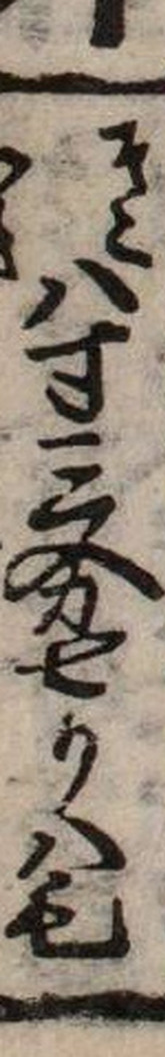そこ八寸三分七り八毛

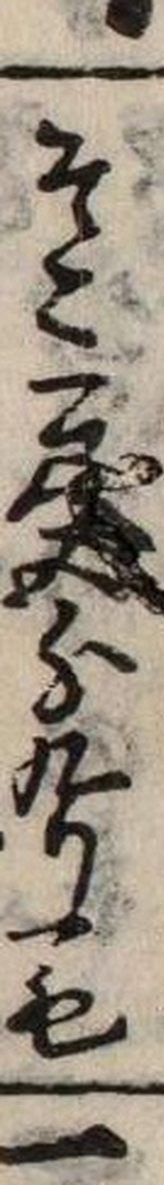そこ一尺五分九り一毛
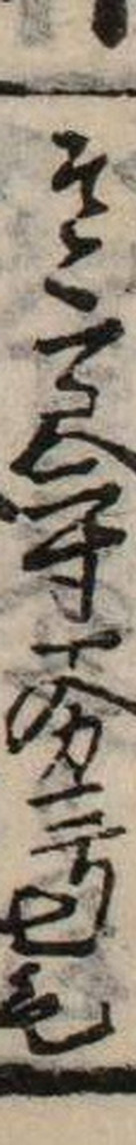そこ一尺二寸一分三り七毛
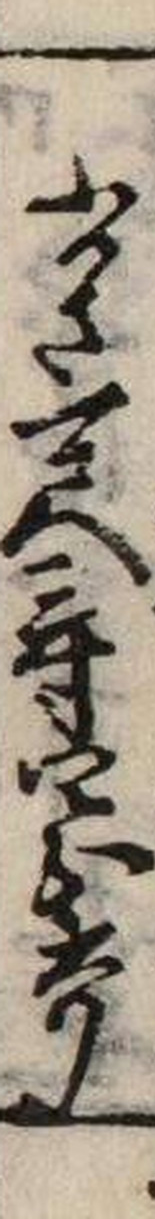ふかさ一尺三寸四分六り
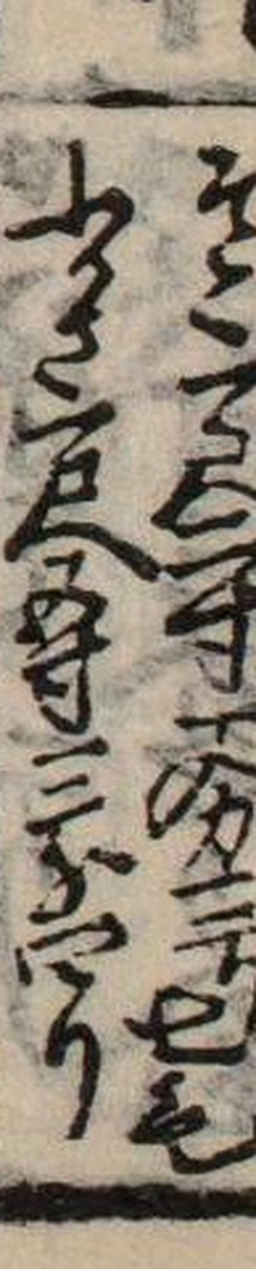ふかさ一尺五寸三分四り
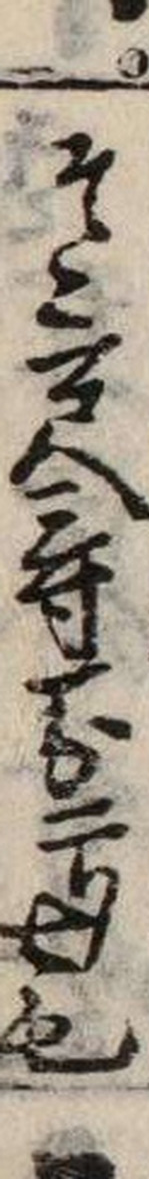そこ一尺三寸一分二り七毛
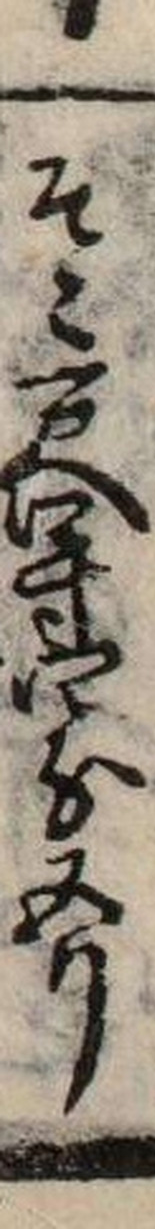そこ一尺四寸四分五り
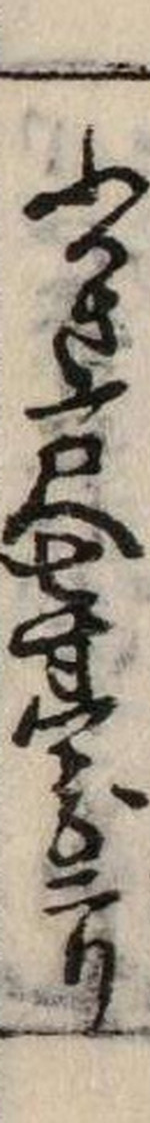ふかさ一尺七寸四分二り
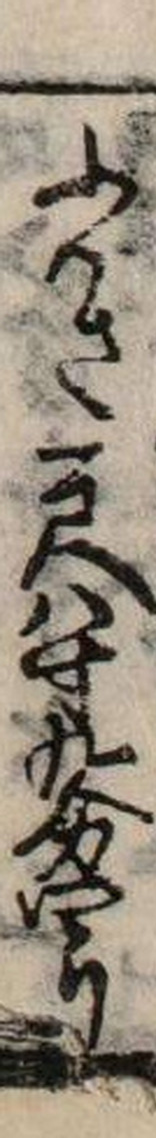ふかさ一尺八寸九分四り
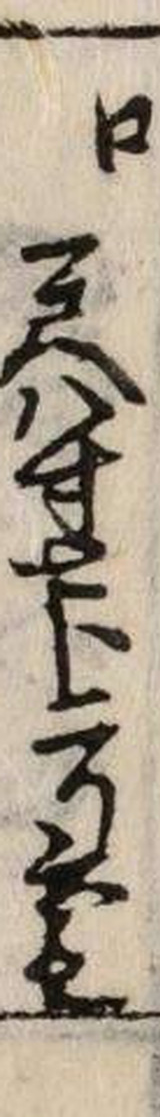そこ一尺八寸四分二り

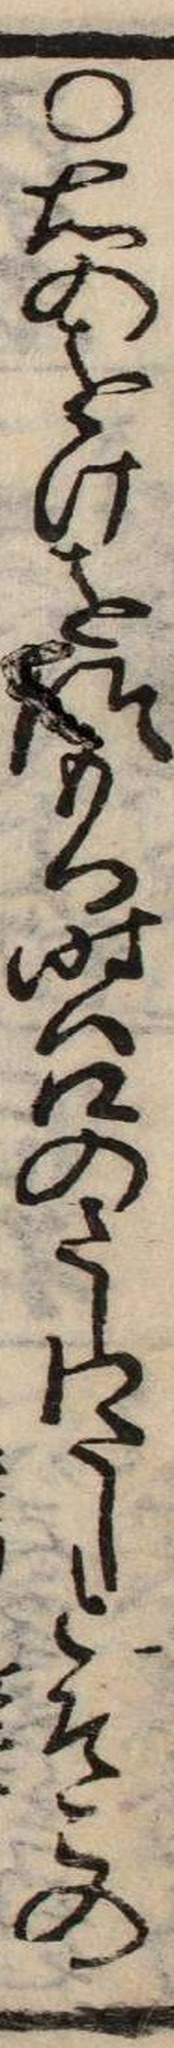○右のをけをつもる時は口のさしわたしとそこの
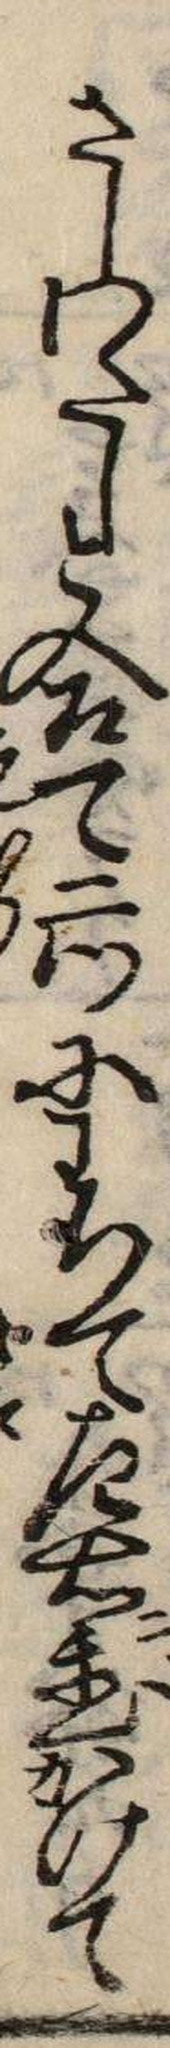さしわたしと又石て二つにわちて左右に置かけて
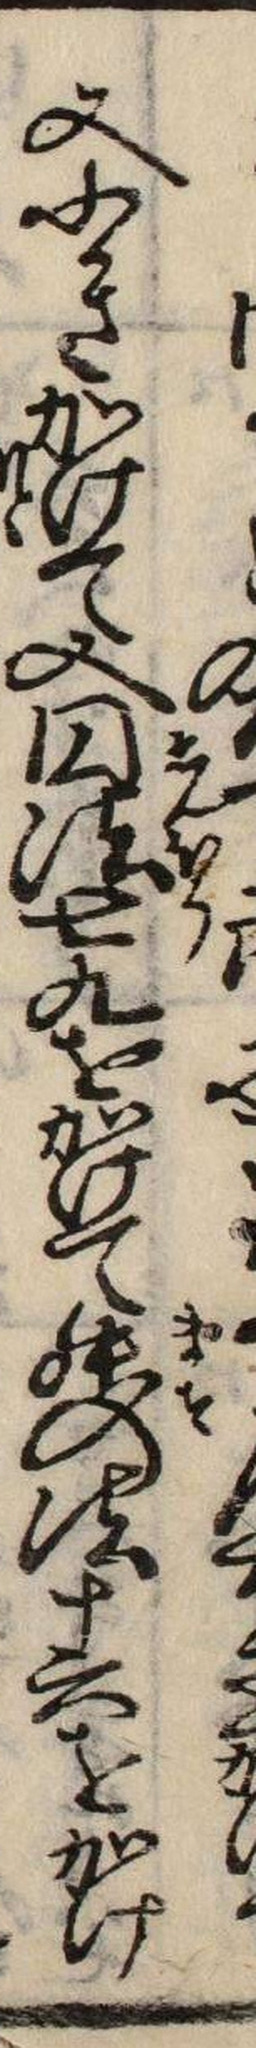又ふかさかけて又円法七九をかけて舛の法十六をかけ
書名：塵劫記（寛永11年自跋、京都府立京都学・歴彩館追貴8）
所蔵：京都府立京都学・歴彩館 国文学研究資料館
